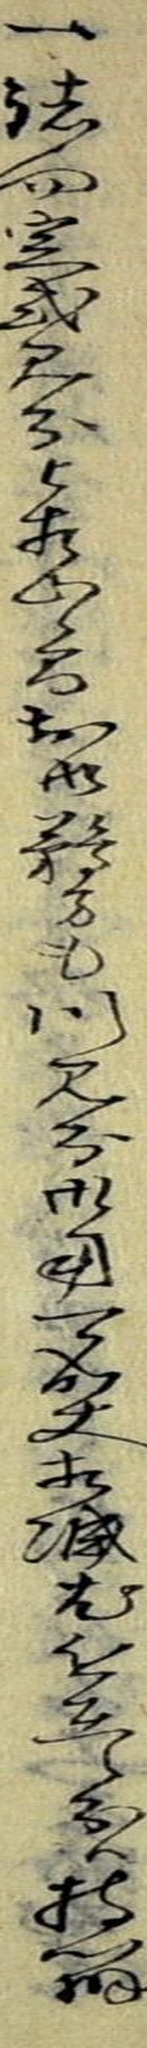一諸向定式見分被相止候間於御鵜方も川見分御用可成丈相減尤近在之分ハ持弁
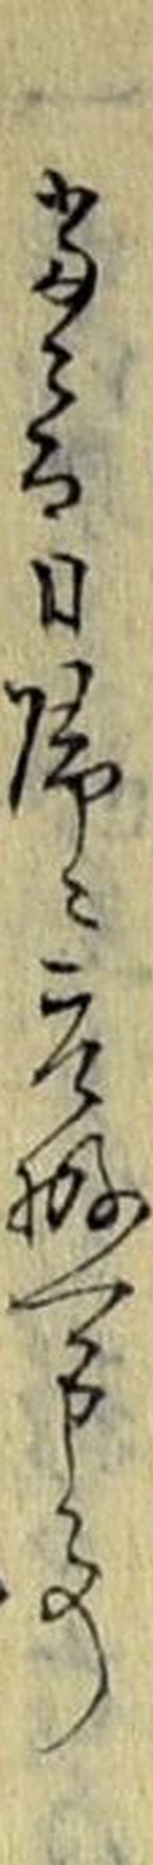当ニ而被帰ニ取扱可申事
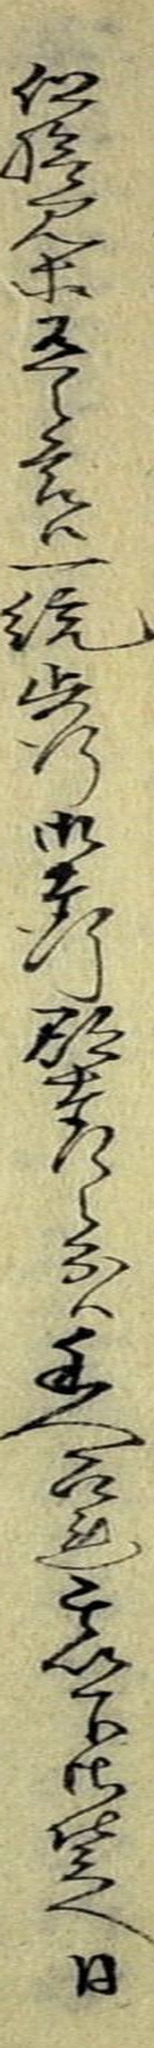但検見等有之節ハ一統歩行御奉行郡奉行之分ハ手人召連其以下御貸人日
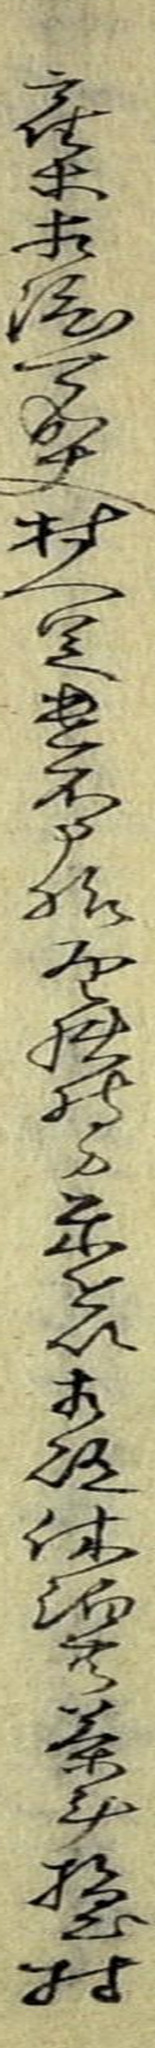雇等相渡可成丈村人足遣不申様物之扶持方米を以相賄休泊共茶計指出村
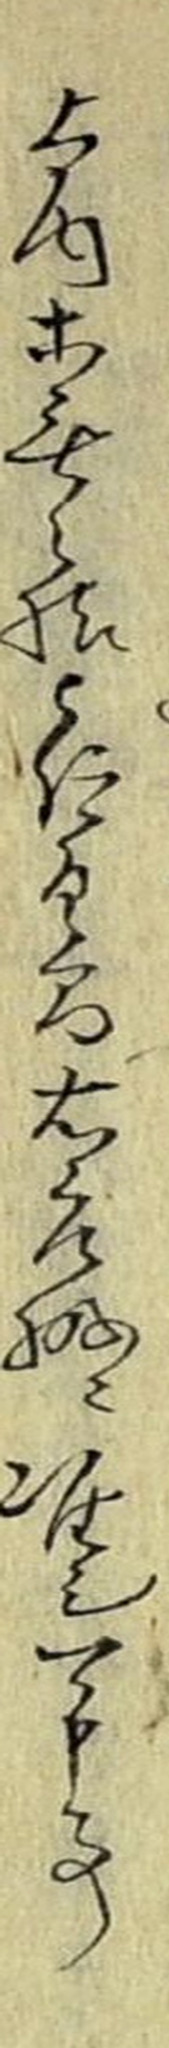ゟ内等無之様被仰付候間右取扱ニ准シ可申事
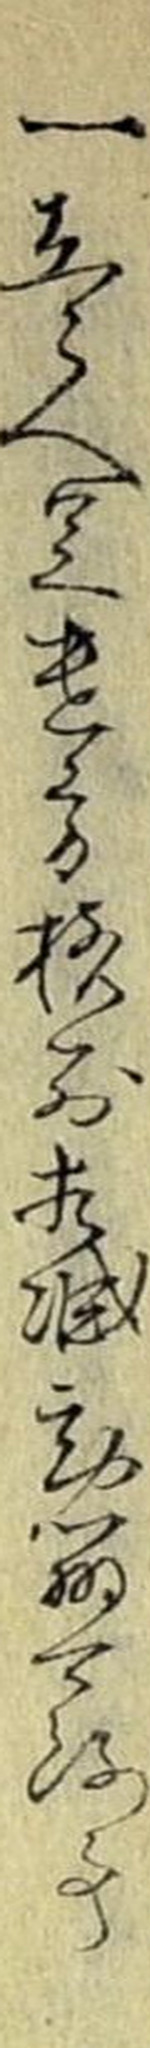一在々人足遣方格別相減勘弁可致事
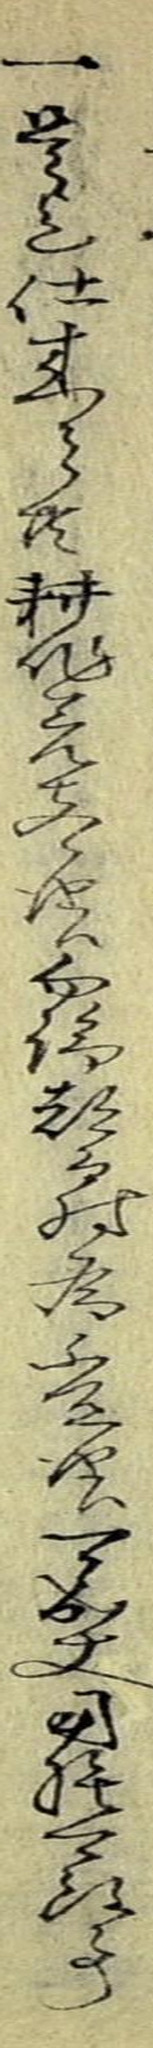一是迄仕来ニ候共耕作差支候儀ハ勿論都而村為不宜儀ハ可成丈用捨可致事
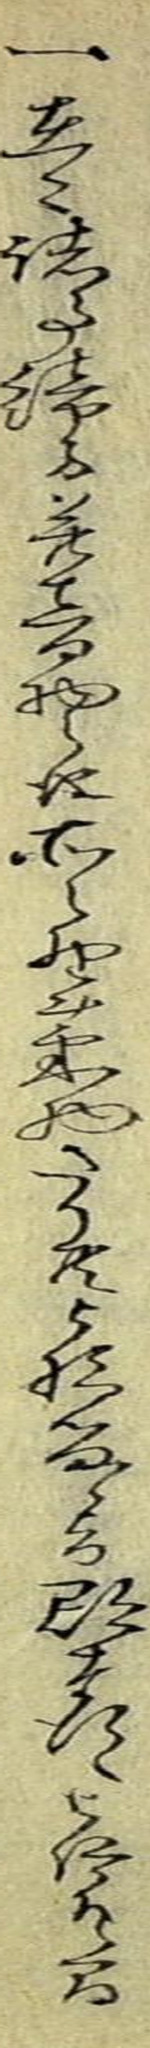一在々諸事締方并音物之儀所之野菜物たり共被指留候旨郡奉行へ被仰付候間
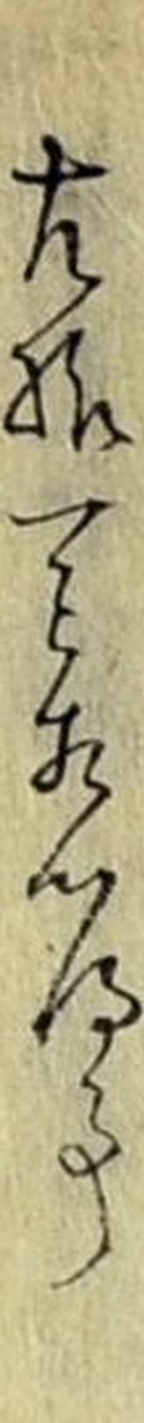左様可被相心得事
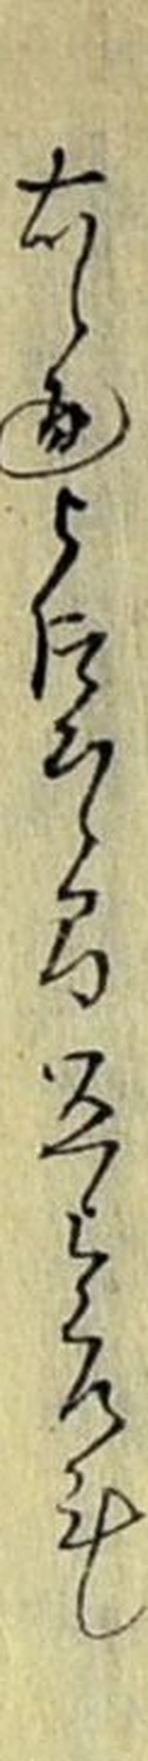右之通被仰出候間宜被取計候
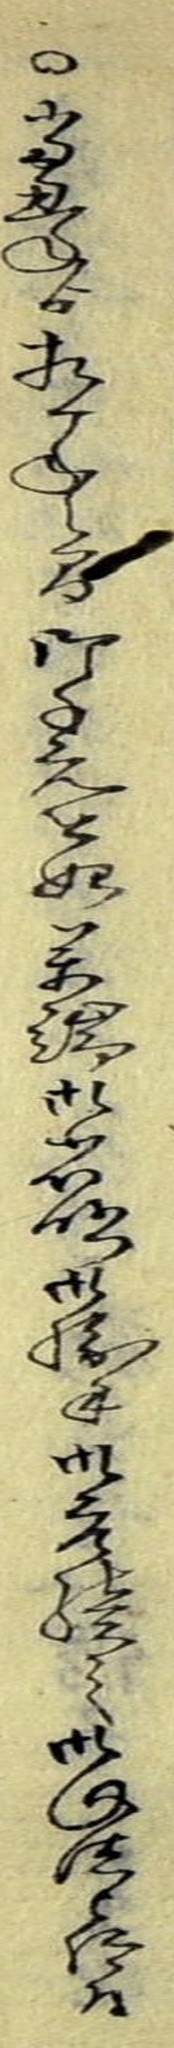○当丑年ゟ拾ケ年之間御手元を始万端御省略御勝手御取続之御趣法被仰付

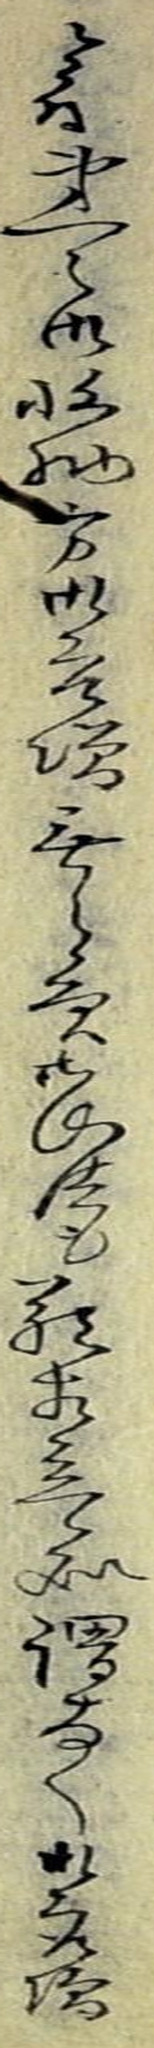候ニ付第一之御収納方御取増無之候而ハ御趣法も難相立候処謂なく御取増
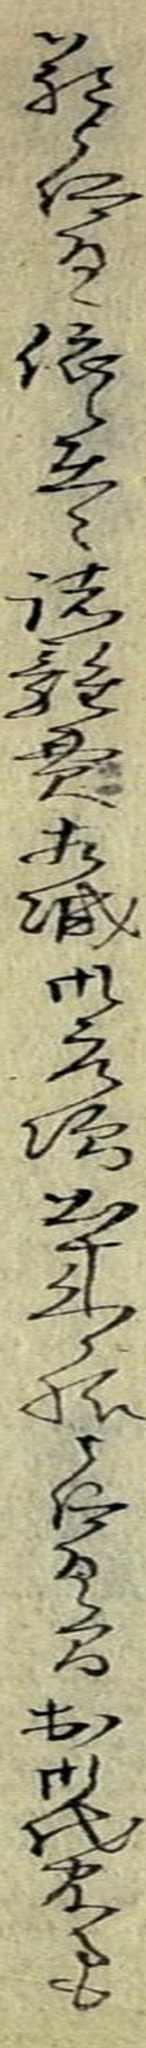難被仰付候依之在々諸雑費相減御取増出来候様被仰付候間於御代官方も
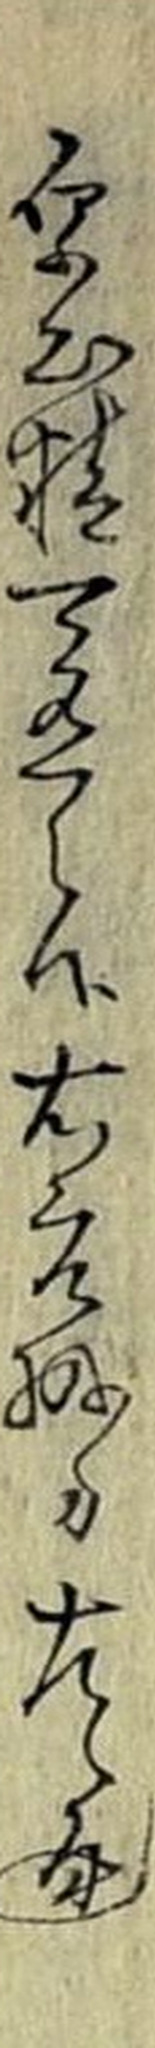厚出精可有之候右取扱方左之通
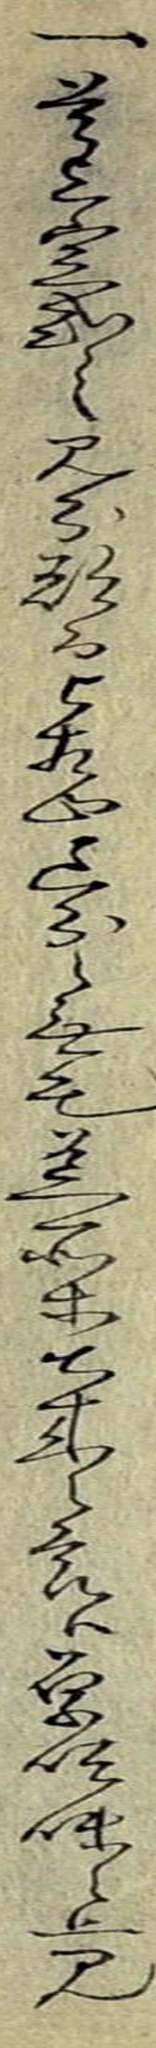一是迄定式之見分都而被相止過分之無毛荒所等出来候節ハ厚吟味之上見
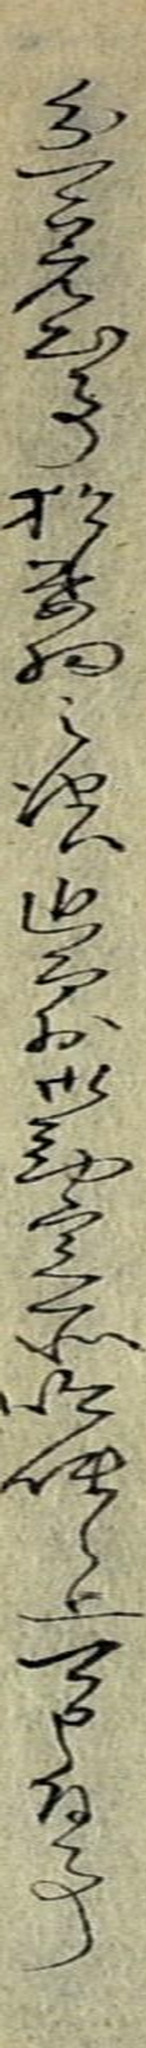分可差出事猶委細之儀ハ廻而於御勤定所吟味之上可申付事
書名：命令之部 五
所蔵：福井県文書館 Fukui Prefectural Archives
